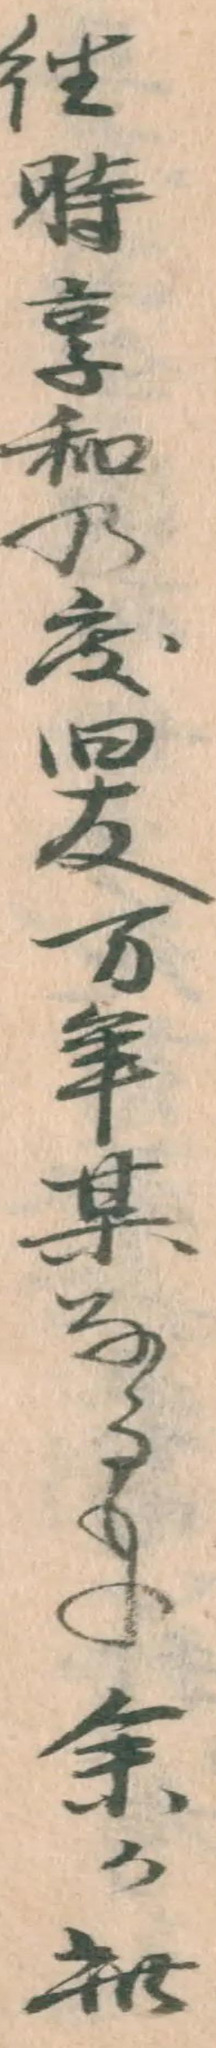往時享和の土度旧友万年某なるもの余か此
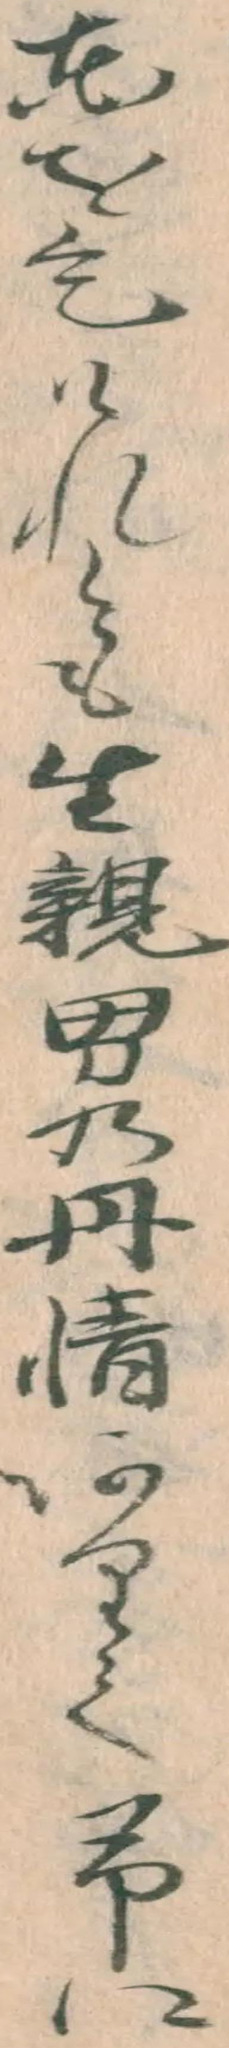花を乞けれとも生親男の丹精ありて予に
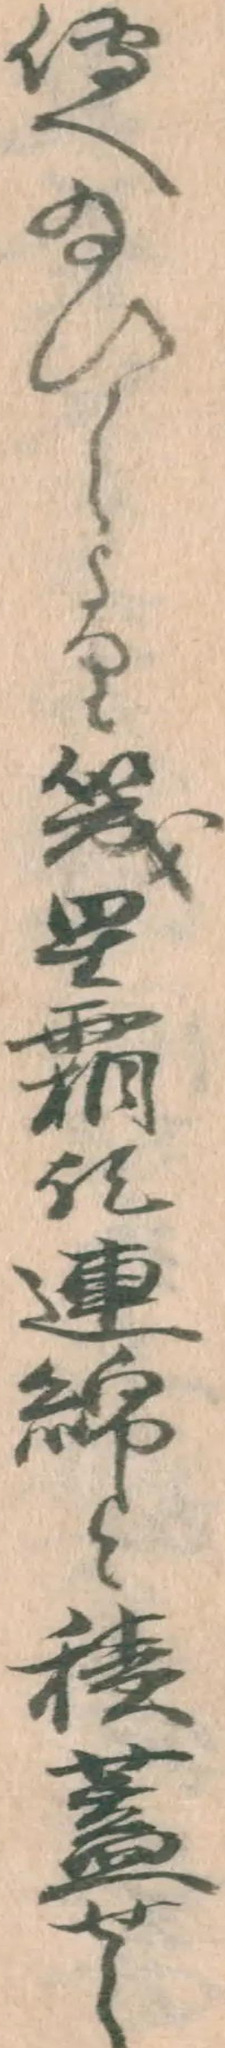伝へ給ひしより幾星霜欤連綿と積蓋せし
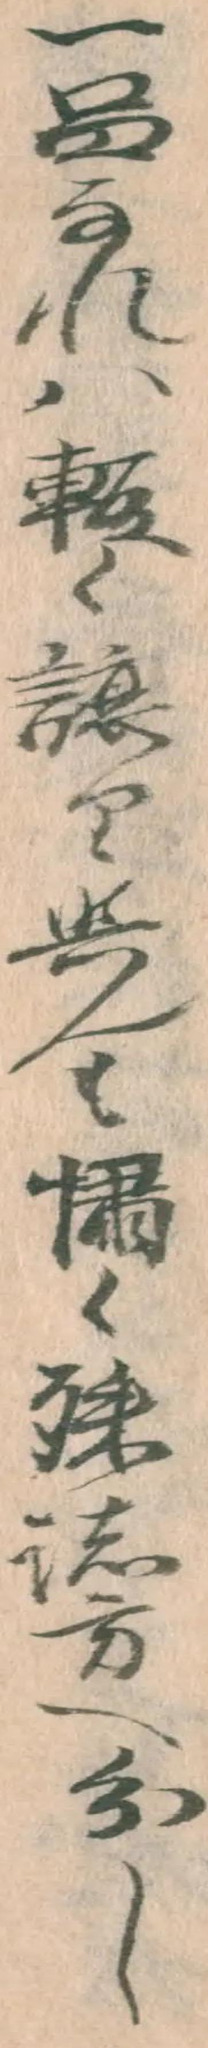一品なれハ軽く譲り与んもく殊諸方へ分し
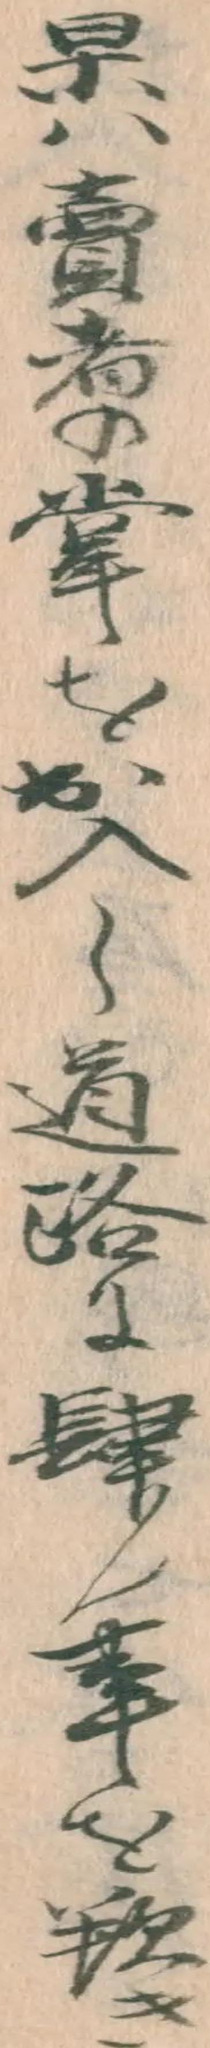ハ売者の掌を出入し道路に肆ん事を叛き
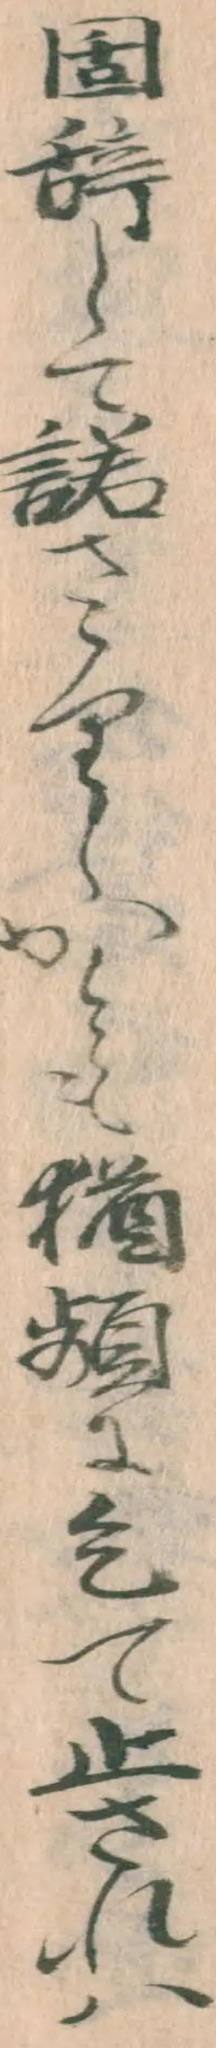固辞して諾さゝりしかとも猶頻に乞て止されハ
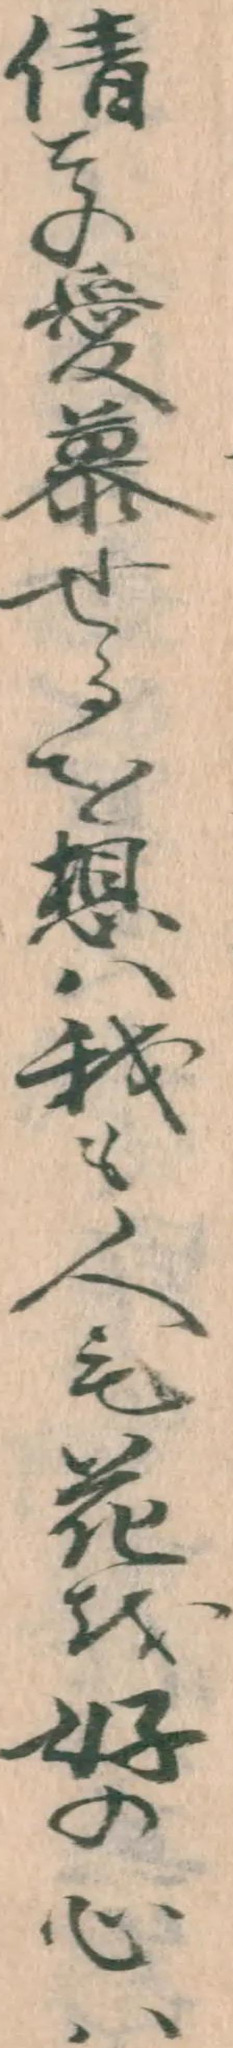倩その愛慕せるを想ハ我も人も花を好の心ハ
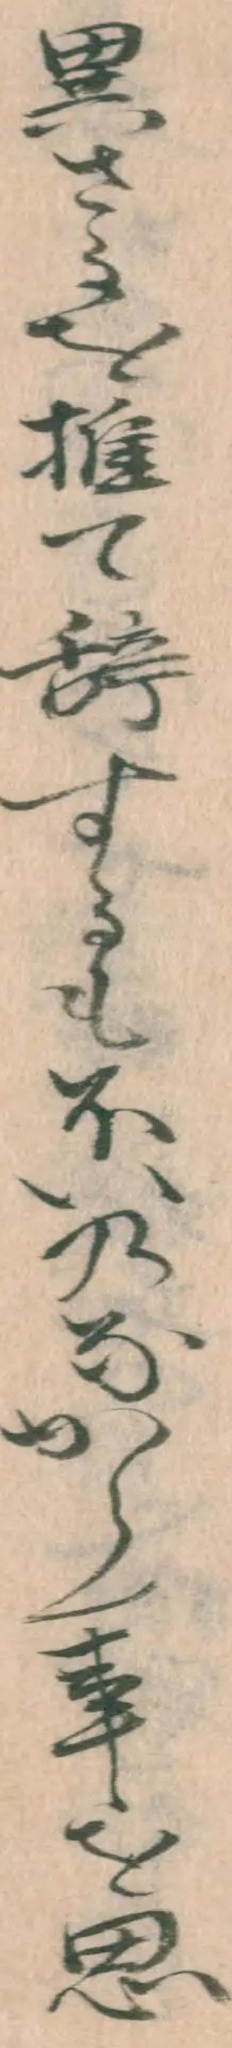異さるを推て辞するもふいのなからん事を思
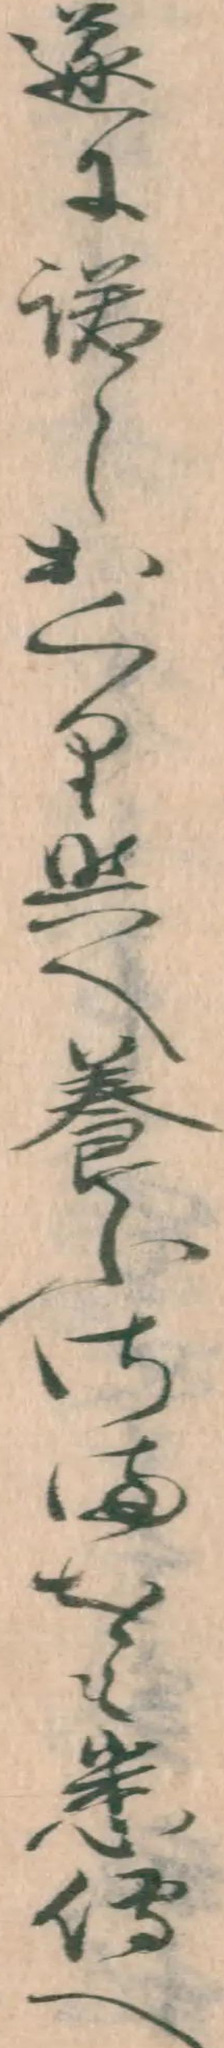遂に諾しおくり与へ養ふさまをも悉伝へ
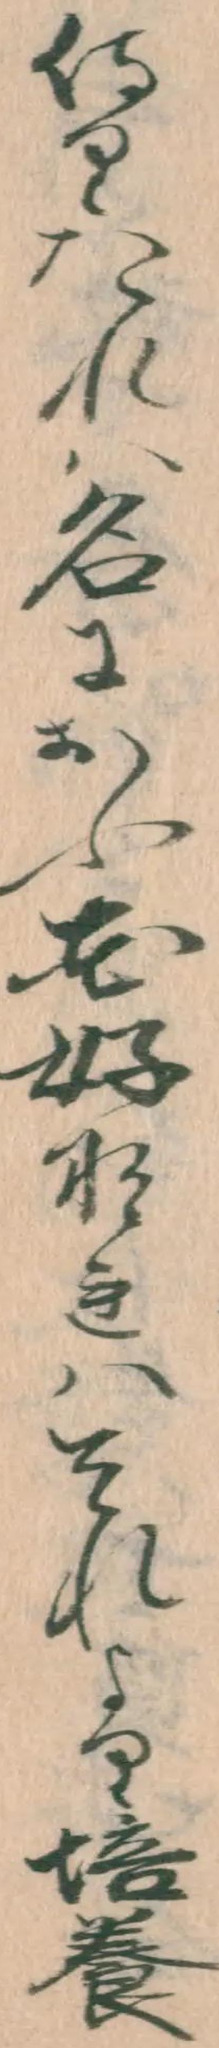伝りたれハ名におふ花好なれハそれより培養
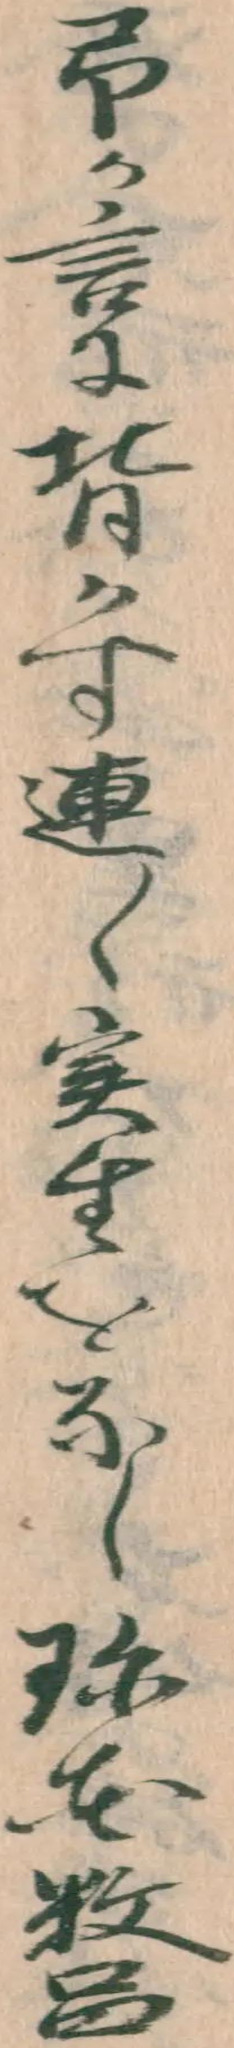予か言に背かすれ〳〵実生をなし珍花数品
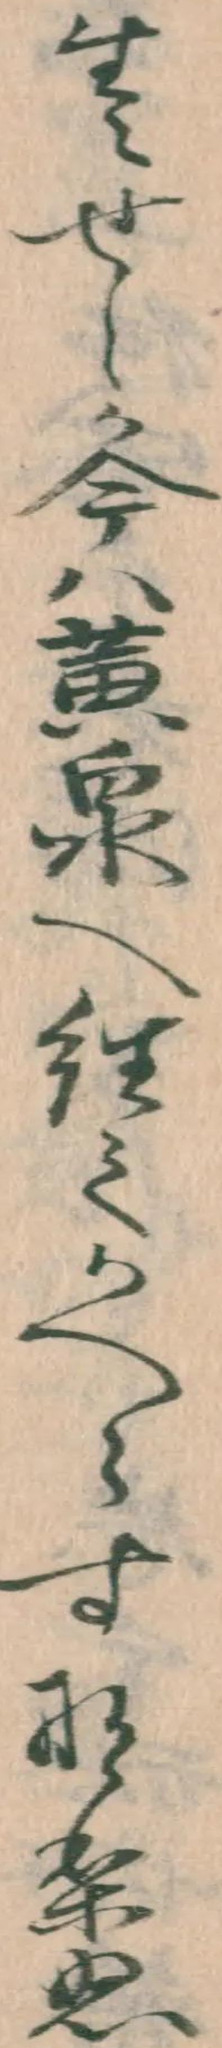生々せしか今ハ黄泉へ征てかへかへらすなり怨
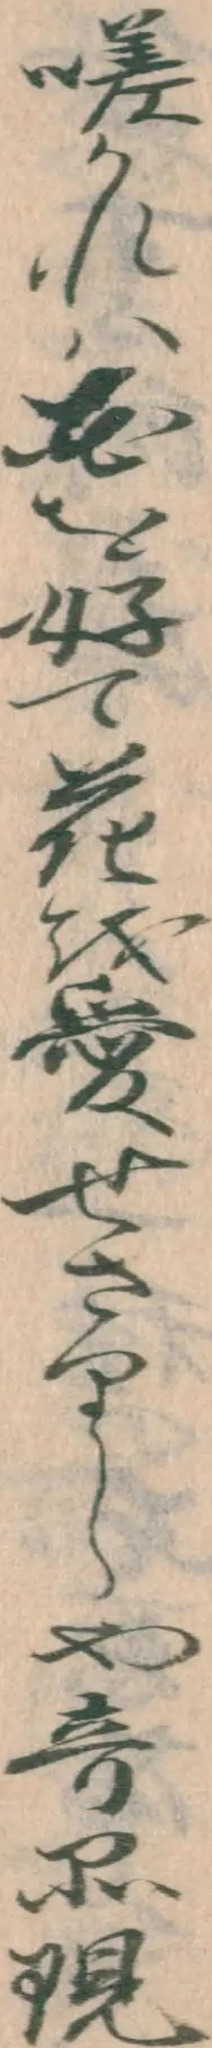嗟かれハ花を好て花を愛せさりしや奇品現
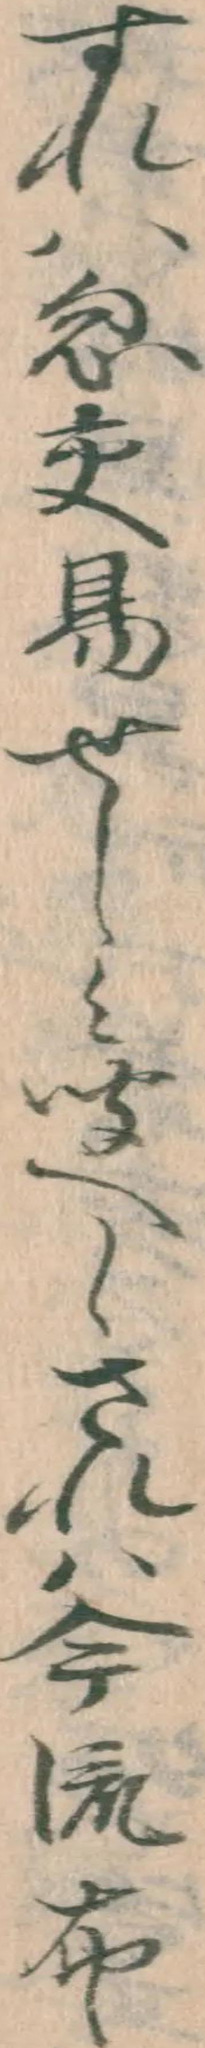すれハ忽交易せしと聞へしされハ今流布
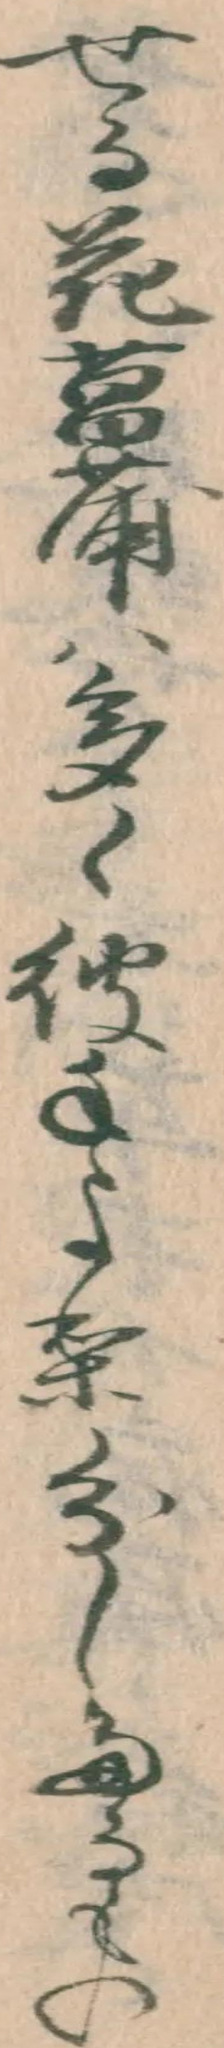せる花菖蒲ハ多く彼により分したるもの
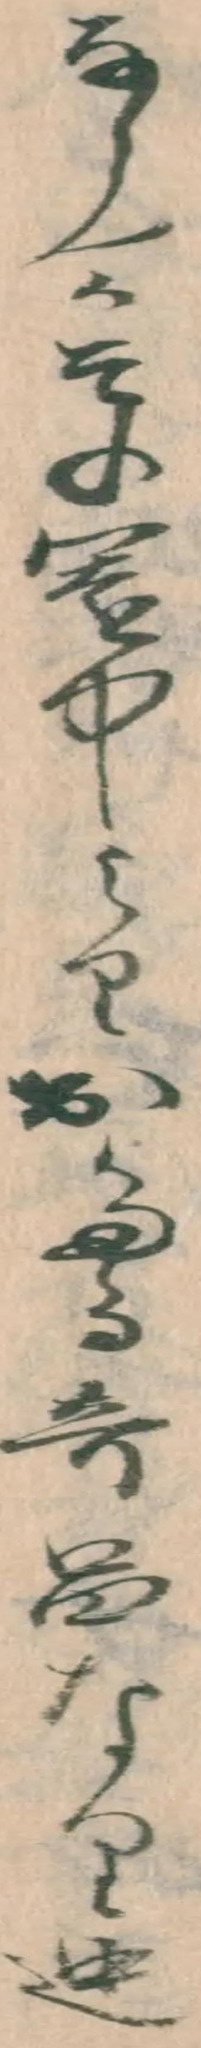ならんかその岡中より出たる奇品なり迚
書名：花菖培養録
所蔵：国立国会図書館 National Diet Library, JAPAN
